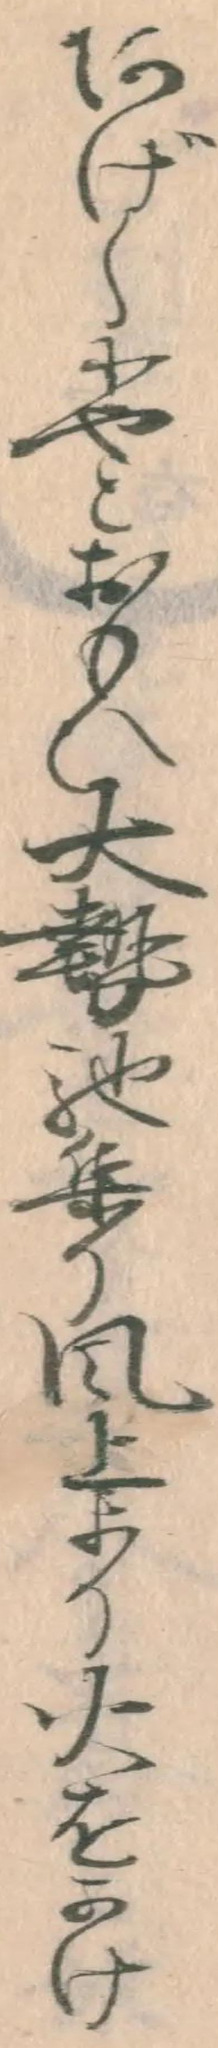あげしにやとおもひ大勢馳参り風上より火をかけ
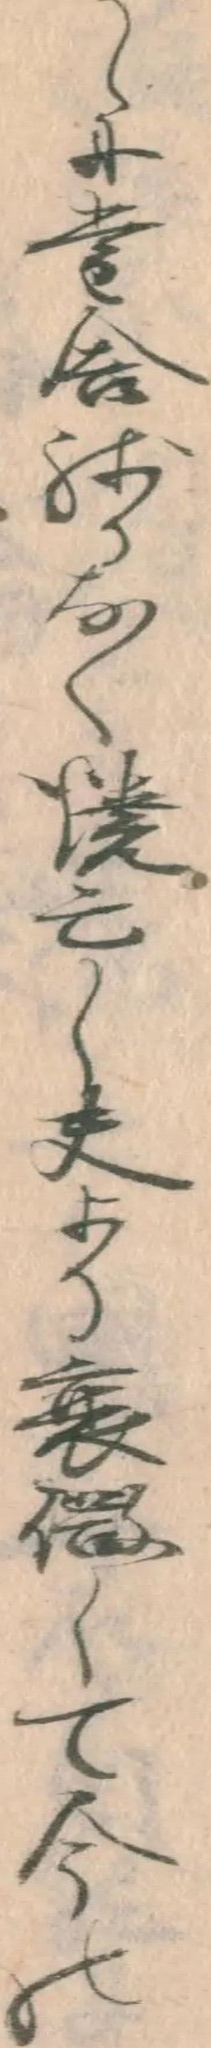しに堂舎残りなく焼亡し夫より衰微して今の
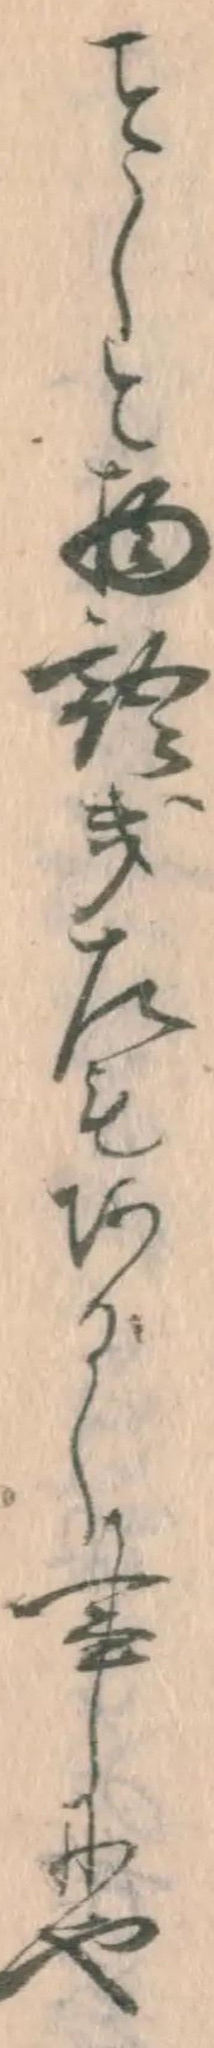ことしと物語き左もありし事にや
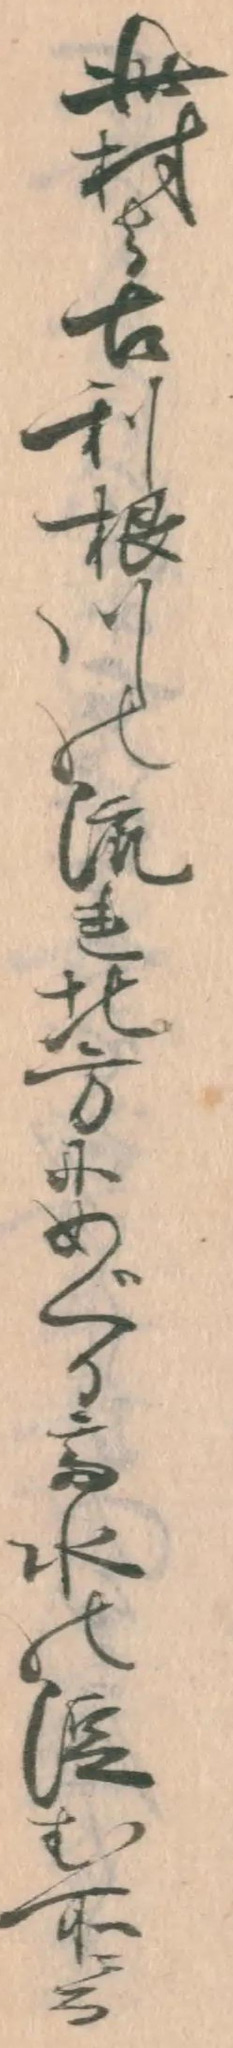此村々古利根川の流れ北方にめぐりて水の淀む所にて
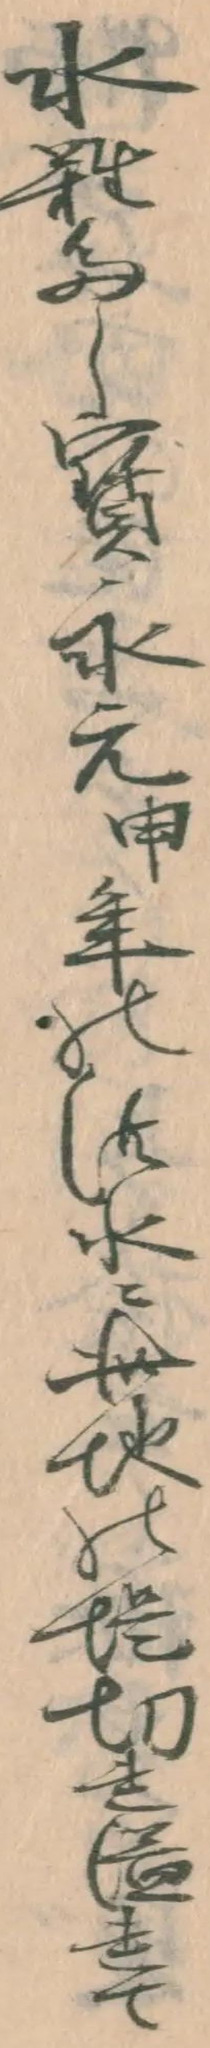水難多し宝永元申年の洪水に此地の堤切れ溢れて
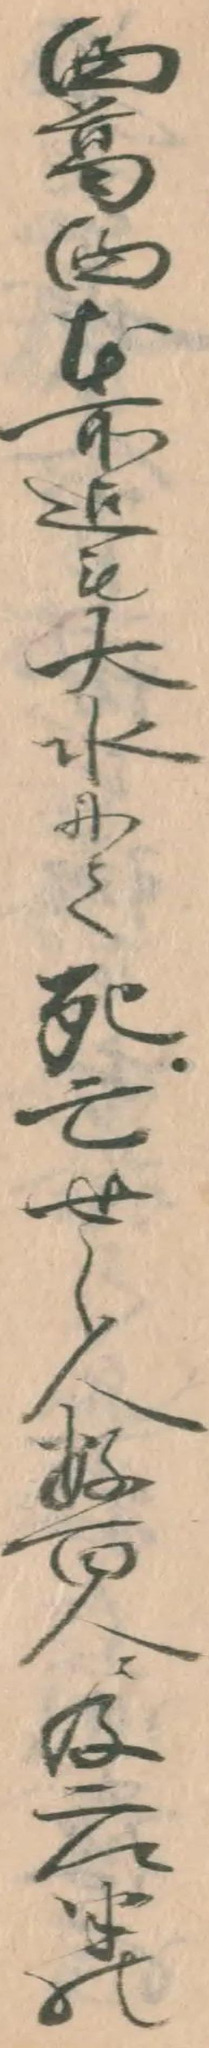西葛西本所迄も大水にて死亡せし人数百人に及二郷半の
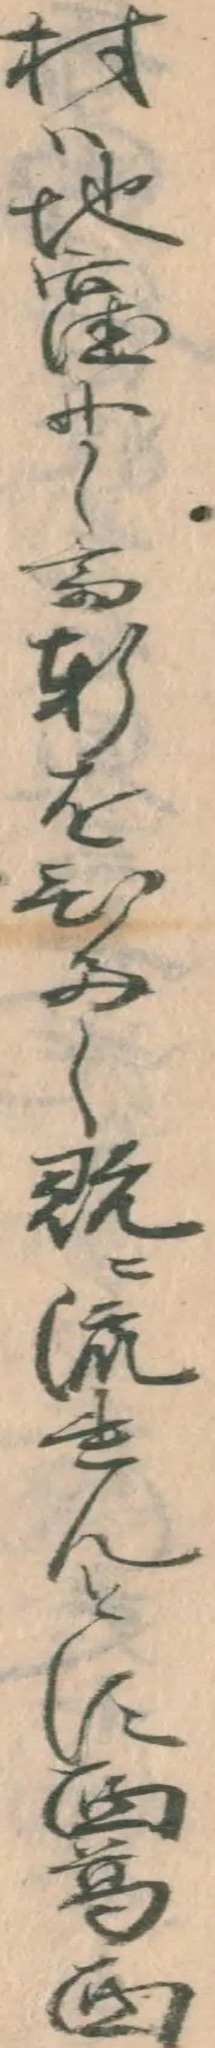村は地窪にして軒をひたし既に流れんとす西葛西
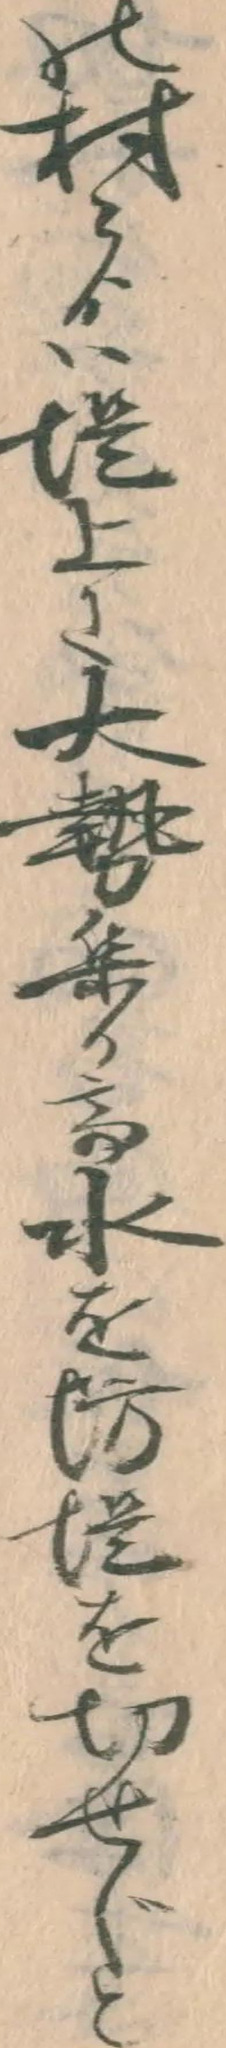の村々よりは堤上に大勢集りて水を防堤を切せじと
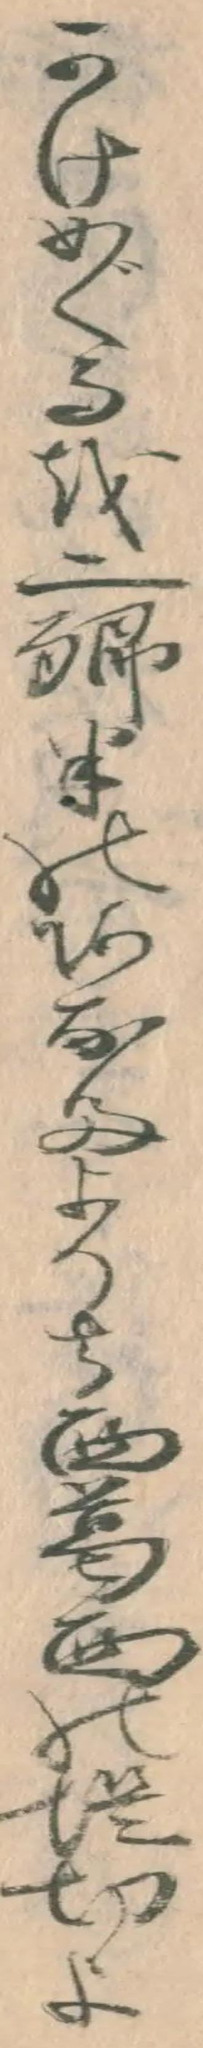かけめぐるを二郷半のあなたよりは西葛西の堤切よ
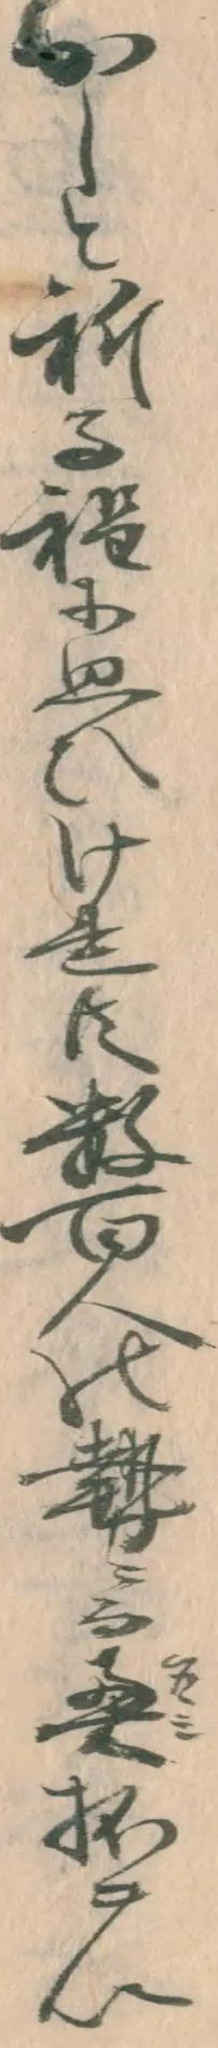かしと祈る程も思ひけれ共数百人の勢にて畳抔を以
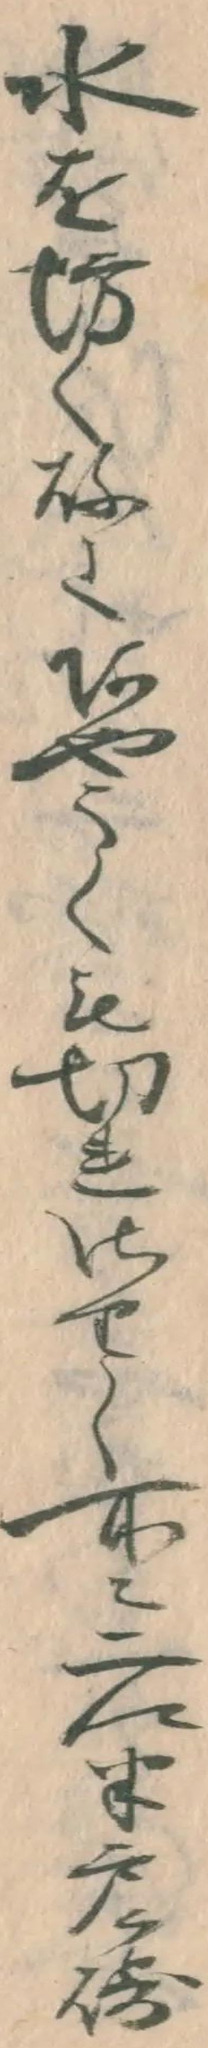水を防く故にあやうくも切れさりし所に二郷半戸ヶ崎
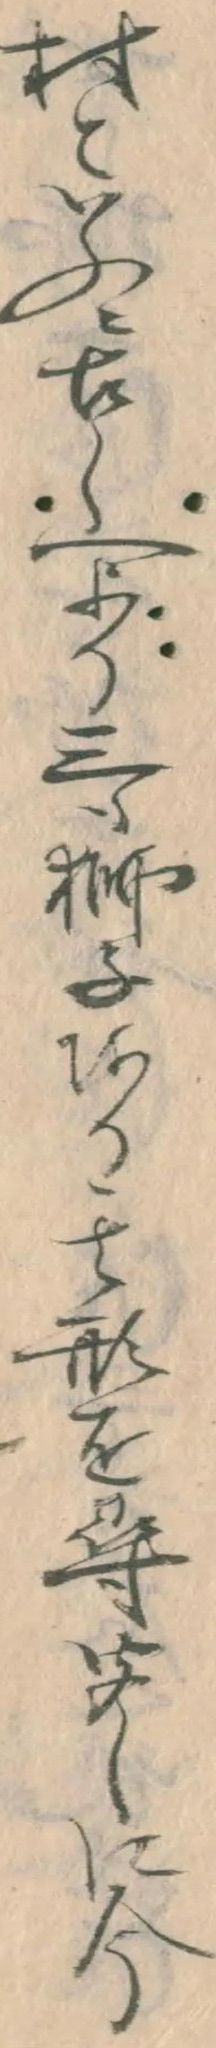村といふに古しへより三つ獅子あり其形を尋聞しに今
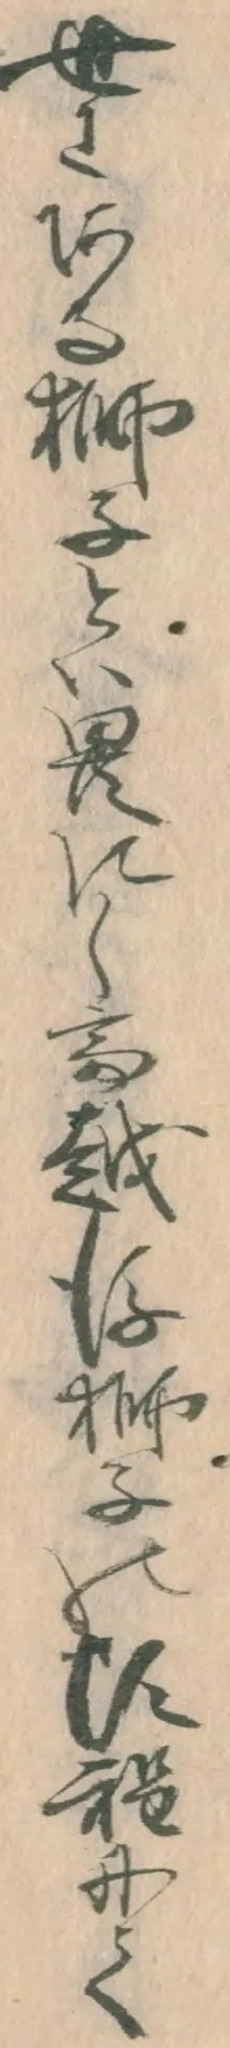世にある獅子とは異にして越後獅子の頭程にて

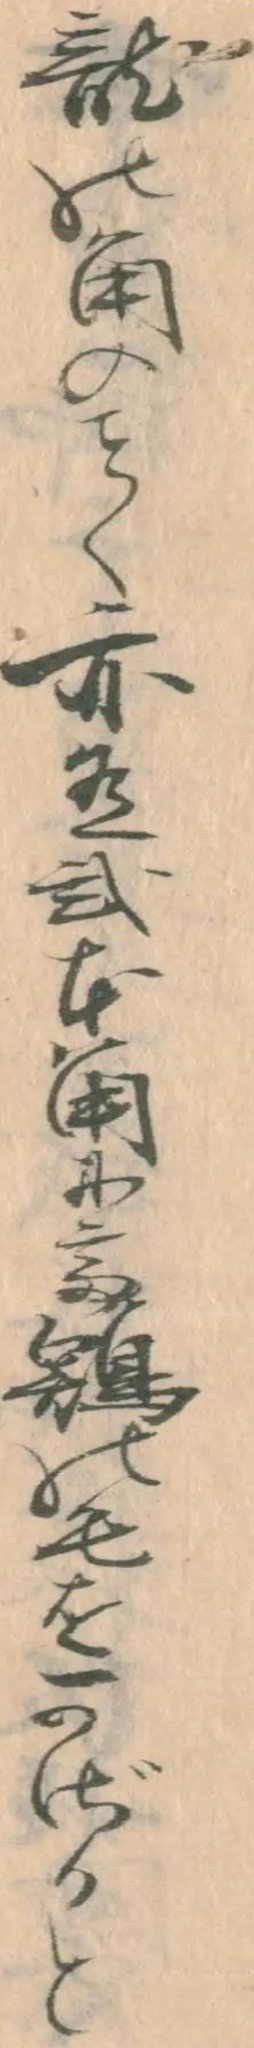龍の角のことく亦有弐本角にて鶏の毛をかざりと
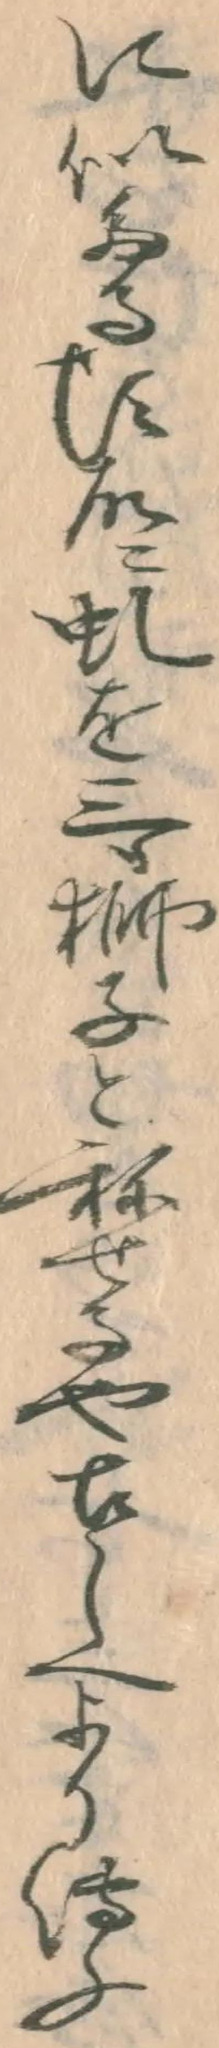に似たる頭故に虬を三つ獅子と称せるや古しへより伝ふ
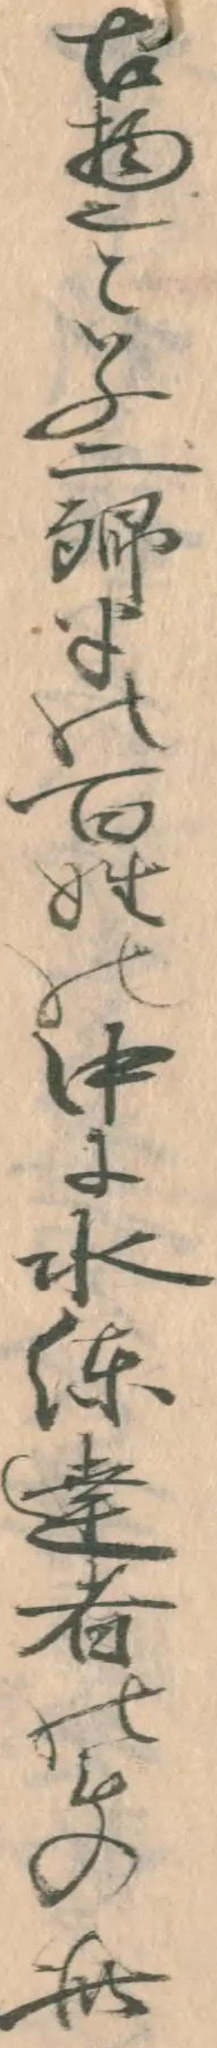古物也といふ二郷半の百姓の中に水練達者のもの此
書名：四神地名録 6巻. [4]葛飾郡
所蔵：国立国会図書館 National Diet Library, JAPAN
